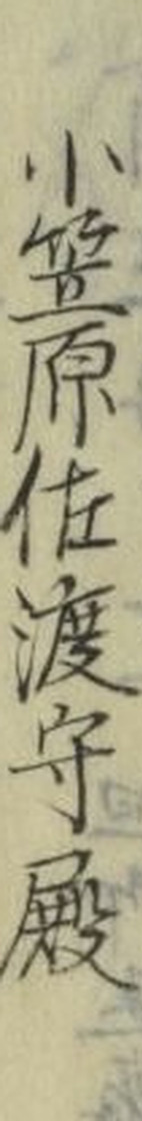小笠原佐渡守殿
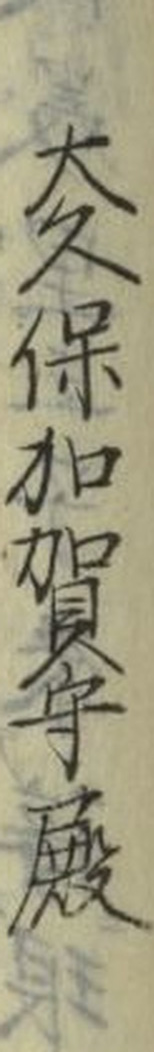大久保加賀守殿
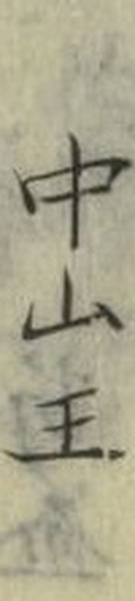中山王

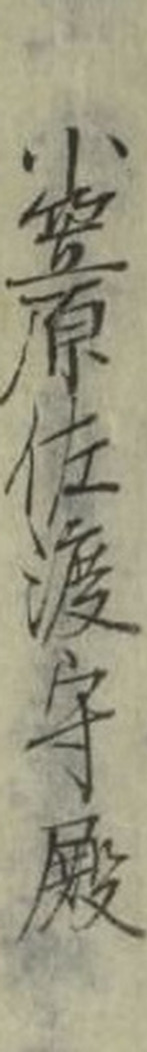小笠原佐渡守殿
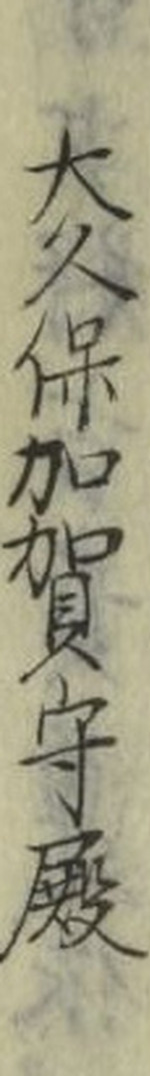大久保加賀守殿
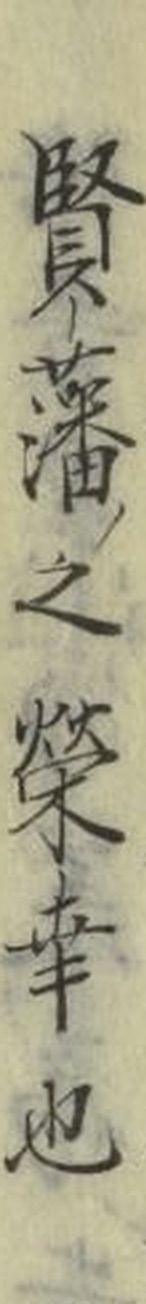賢-藩之栄幸也
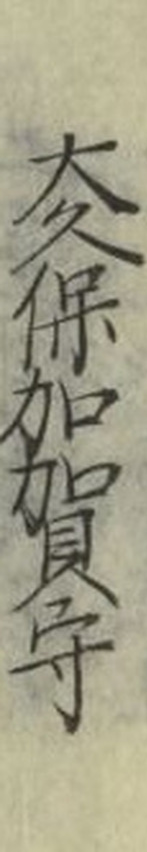大久保加賀守
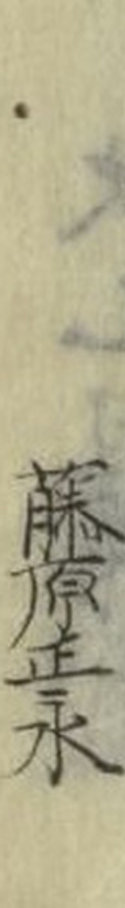藤原正永
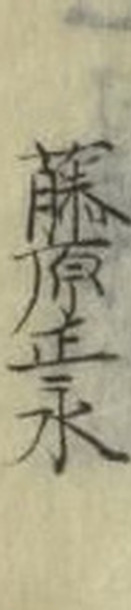藤原正永

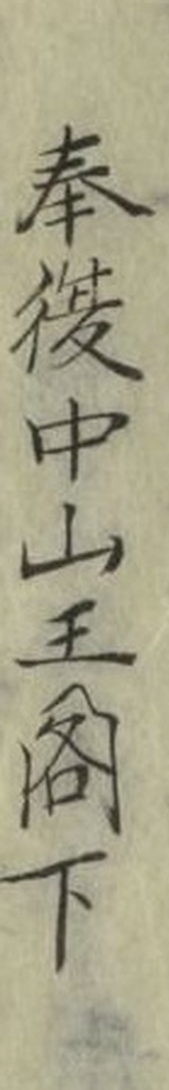奉復中山王閣下
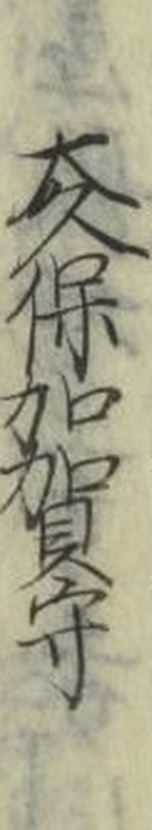大久保加賀守
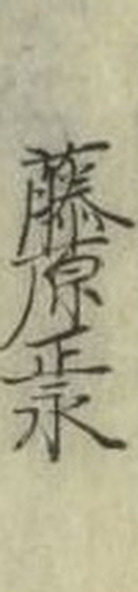藤原正永

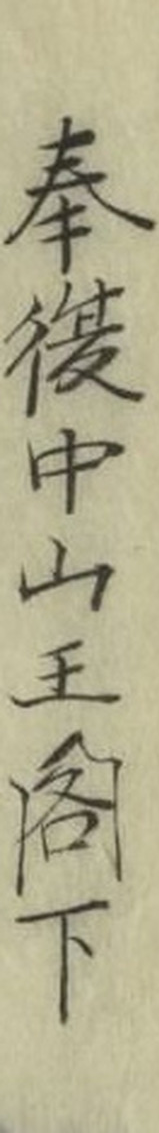奉復中山王閣下
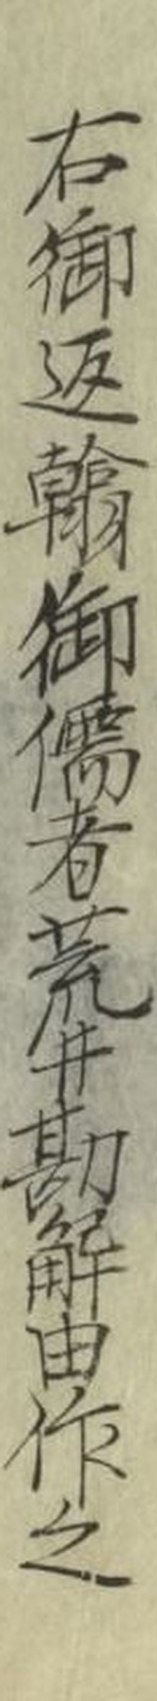右御返翰御儒者荒井勘解由作之
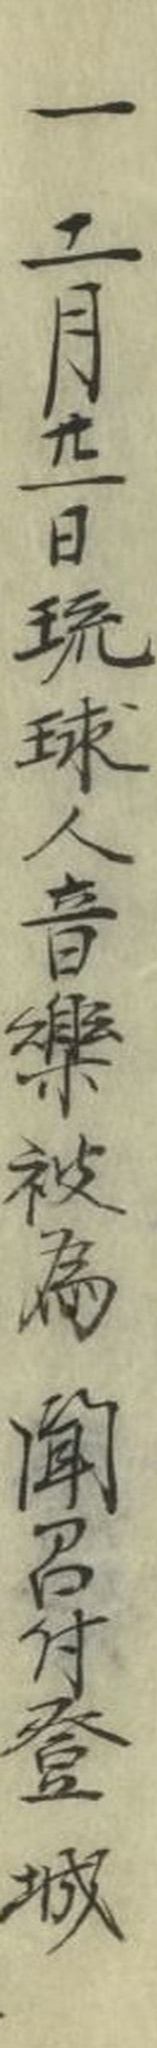一十一月廿一日琉球人音楽被為聞召付登城
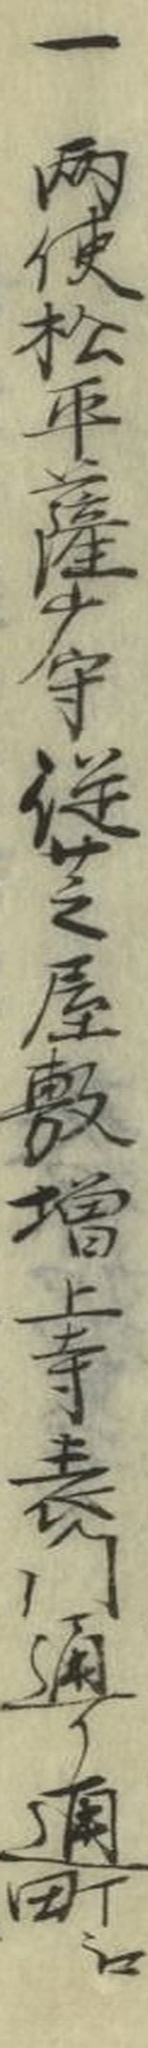一両使松平薩摩守従芝屋敷増上寺表門通り通町え
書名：宝永七庚寅年琉球国来聘使日記
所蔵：University of the Ryukyus Library
